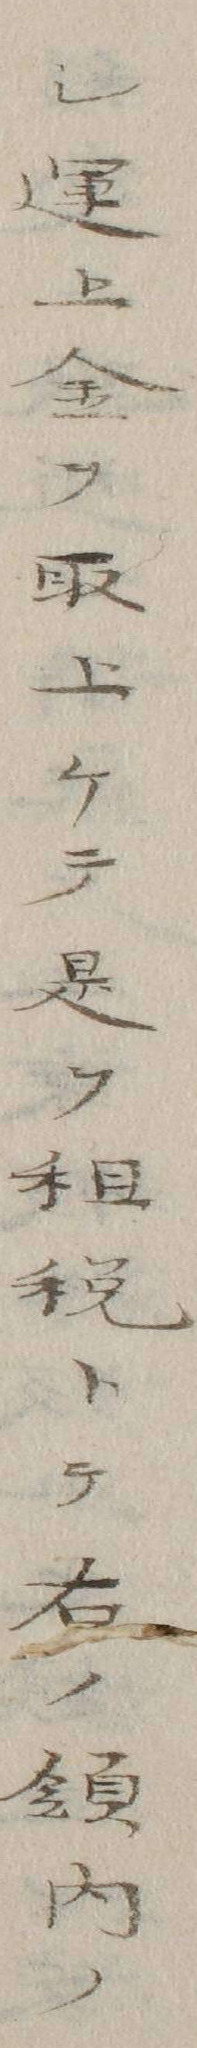シ運上金ヲ取上ケテ是ヲ租税トテ右ノ領内ノ
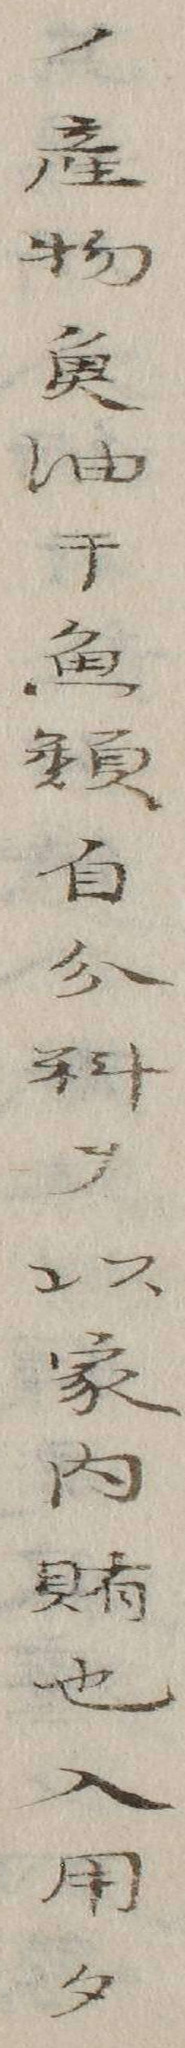ノ産物魚油干魚類自分料ヲ以家内賄也入用タ
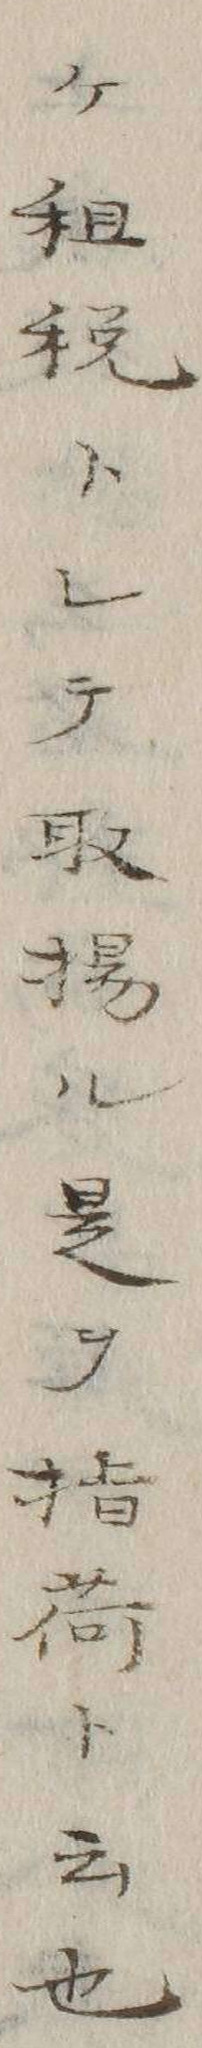ケ租税トシテ取揚ル是ヲ指荷ト云也
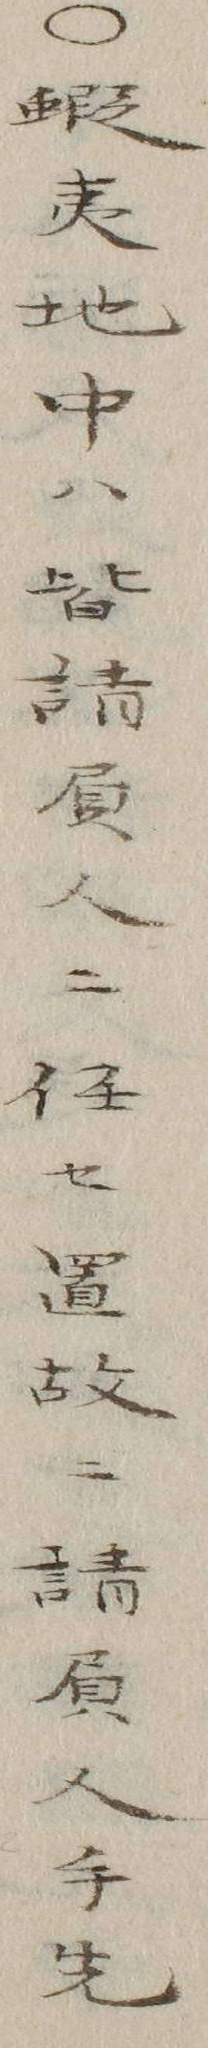〇蝦夷地中ハ皆請負人ニ任セ置故ニ請負人手先
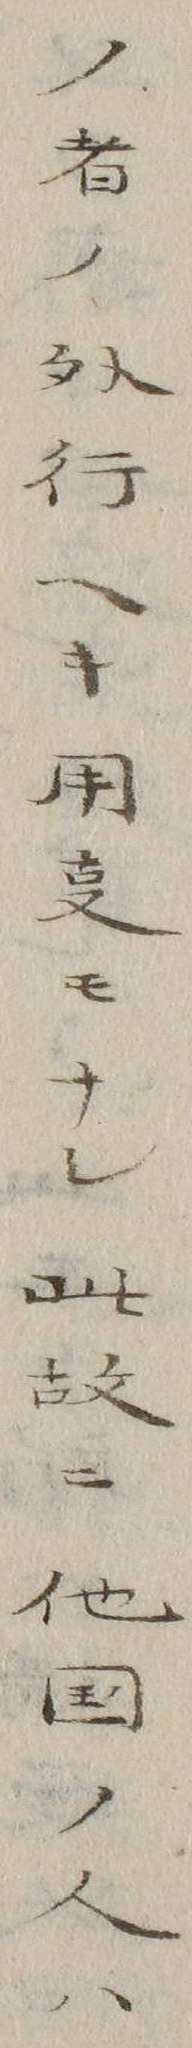ノ者ノ外行ヘキ用事モナシ此故ニ他国ノ人ハ
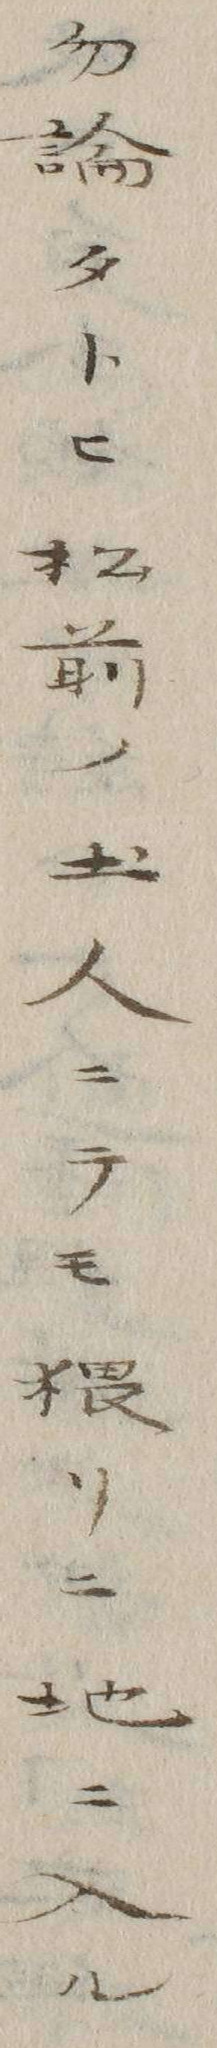勿論タトヒ松前ノ土人ニテモ猥リニ地ニ入ル
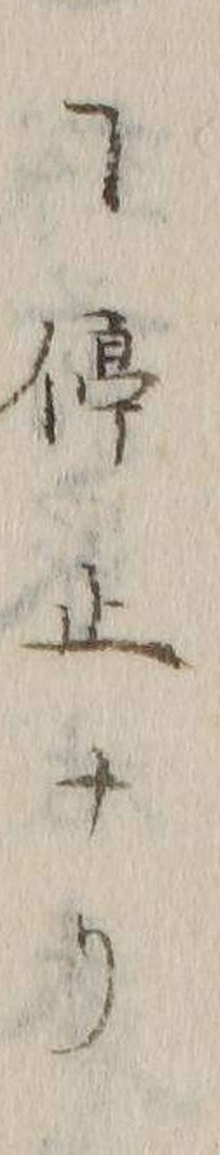ヿ停止ナリ
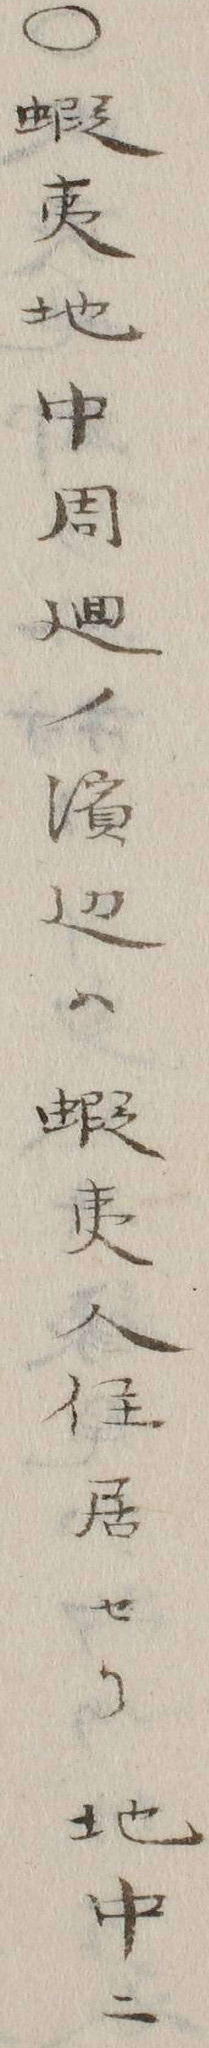〇蝦夷地中周廻ノ浜辺ハ蝦夷人住居セリ地中ニ
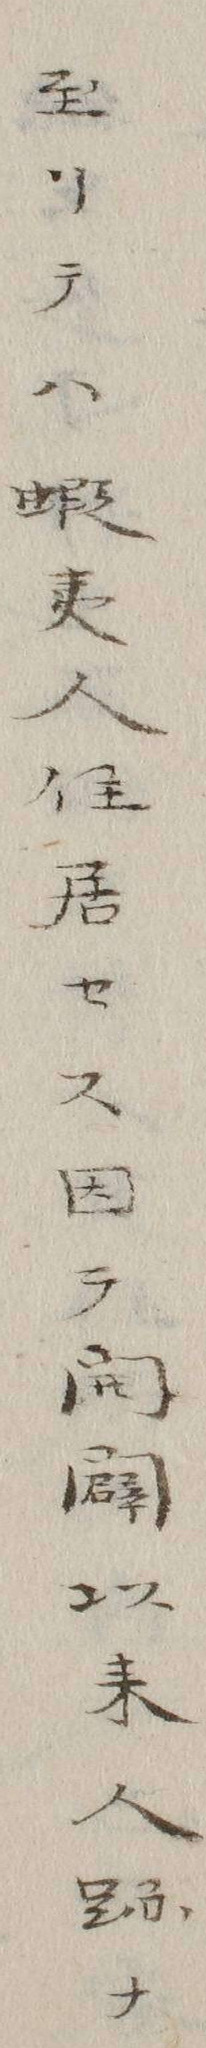至リテハ蝦夷人住居セス因テ開闢以来人跡ナ
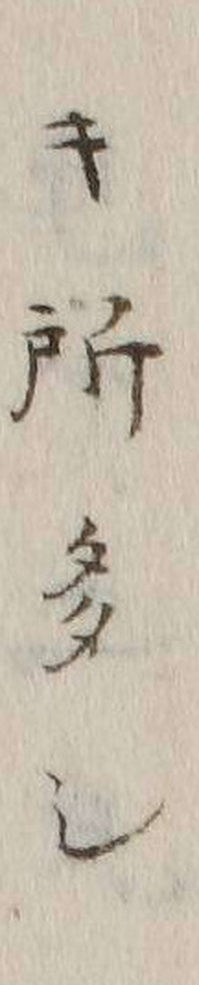キ所多シ
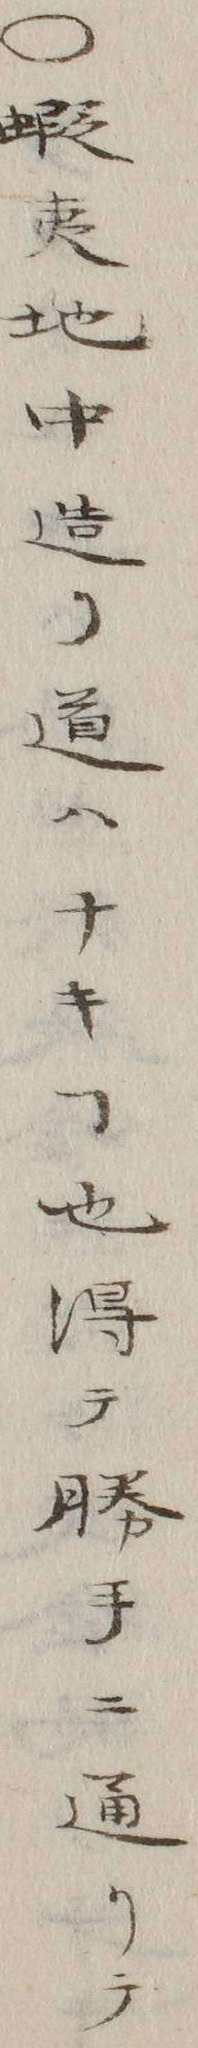〇蝦夷地中造リ道ハナキヿ也得テ勝手ニ通リテ
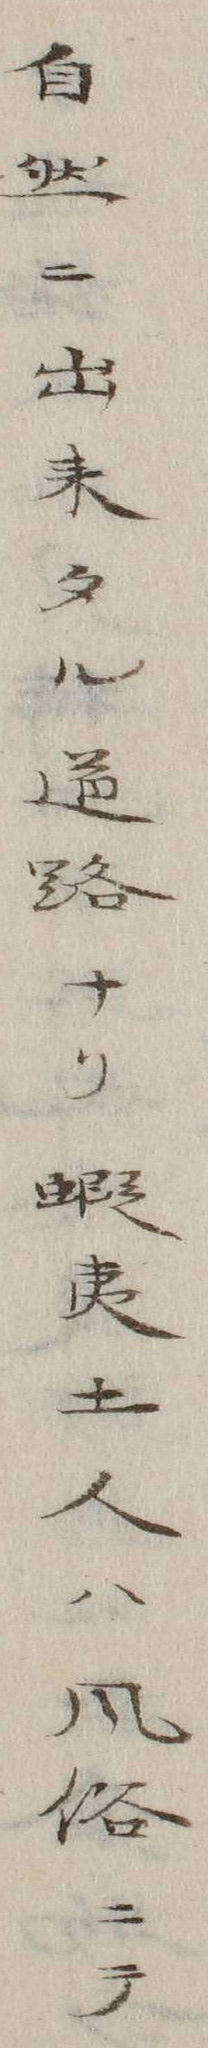自然ニ出来タル道路ナリ蝦夷土人ハ風俗ニテ
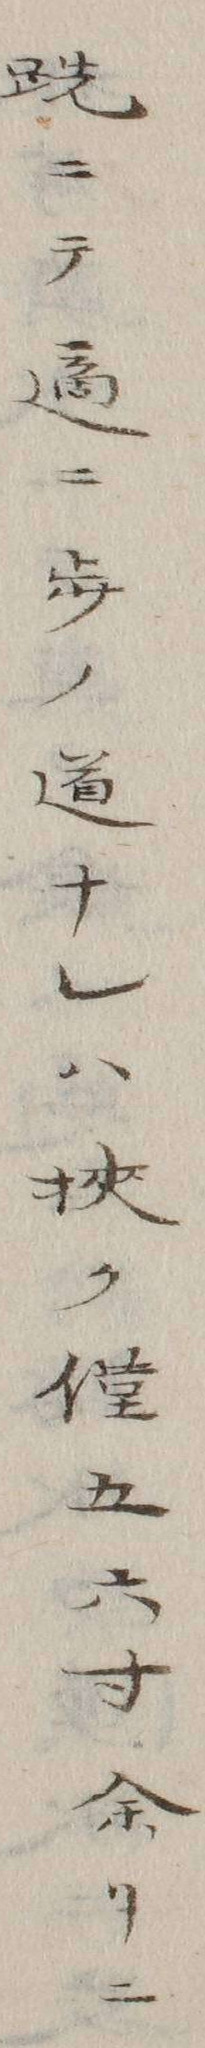跣ニテ適ニ歩ノ道ナレハ狭ク僅五六寸余リニ
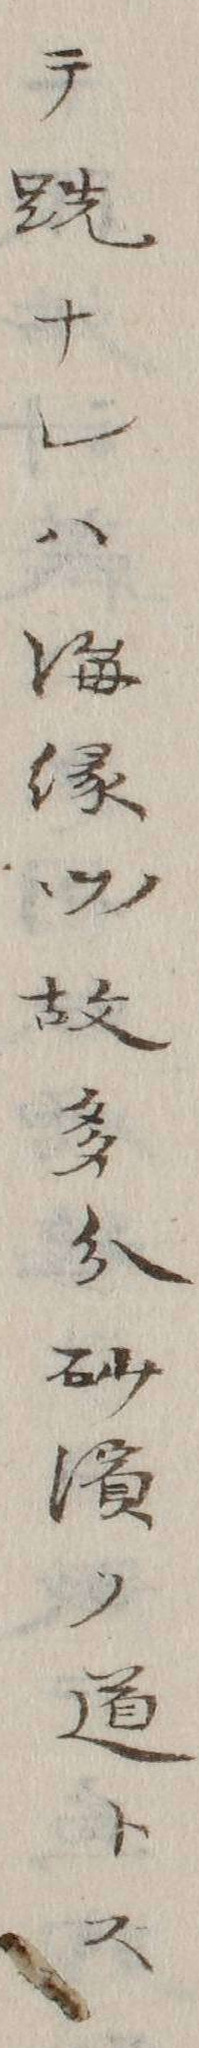テ跣ナレハ海縁ノ故多分砂浜ノ道トス
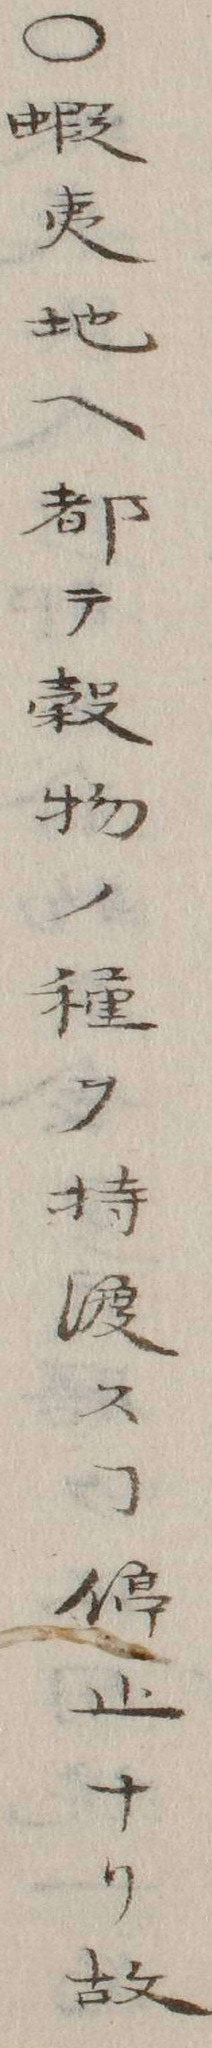〇蝦夷地ヘ都テ穀物ノ種ヲ持渡スヿ停止ナリ故
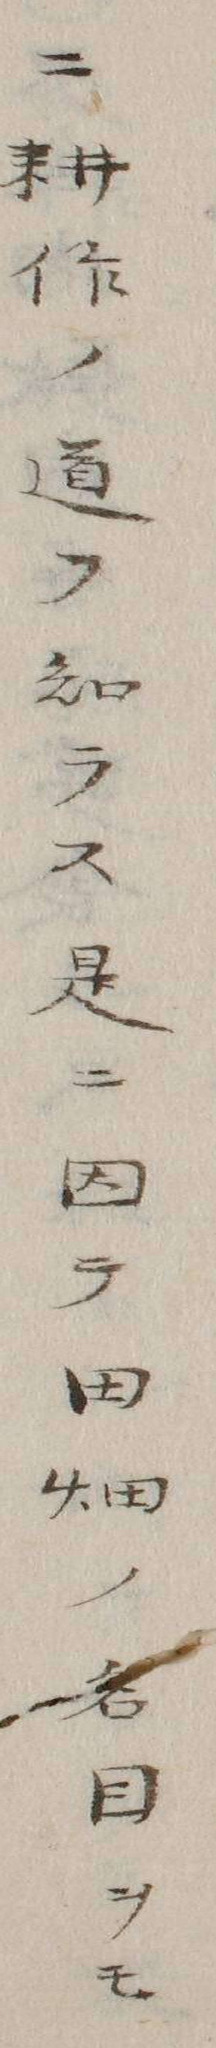ニ耕作ノ道ヲ知ラス是ニ因テ田畑ノ名目ヲモ
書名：蝦夷草紙（国文学研究資料館）
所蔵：国文学研究資料館
